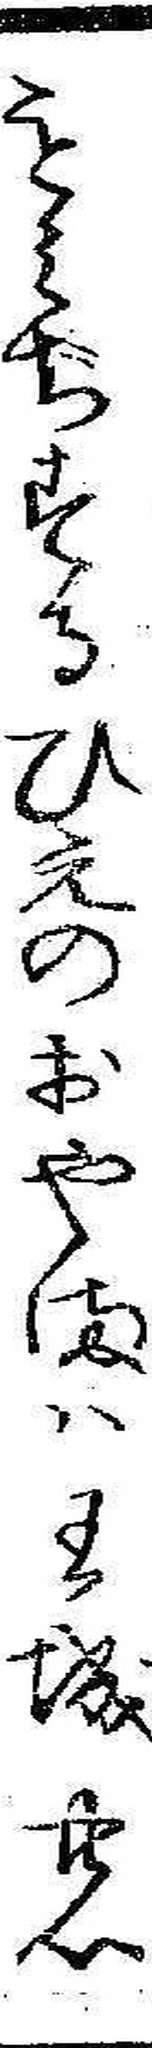もみぢするひえのおやまは王城の
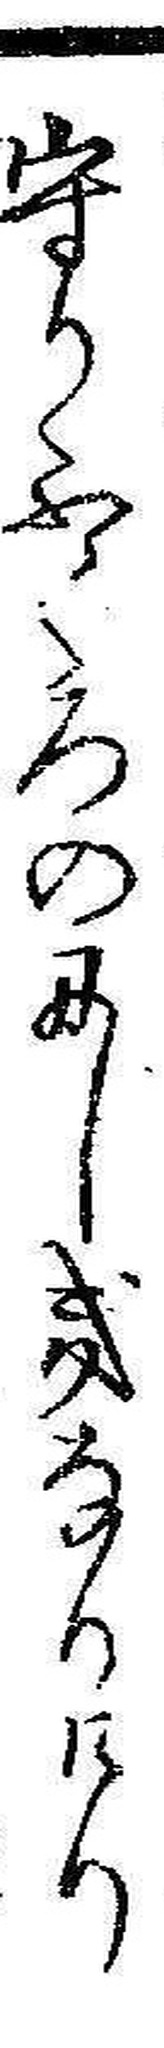守りふくろのにしきなりけり
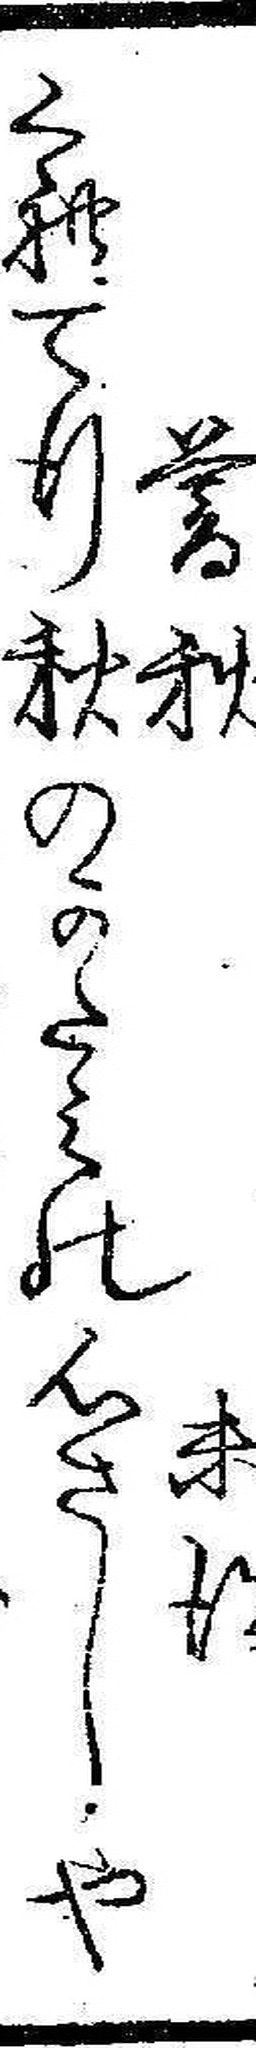くれて行秋のかたみの心さしや
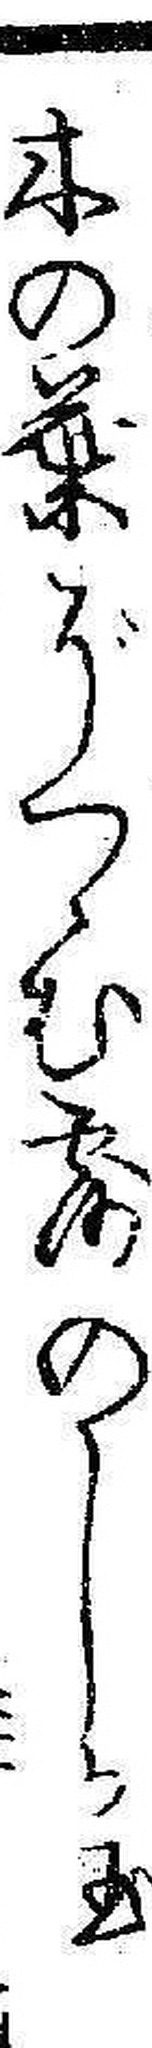木の葉ぞつゝむ露のしら玉

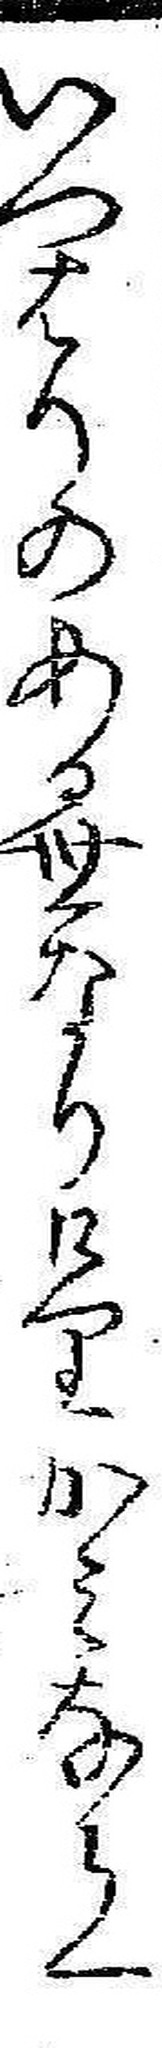いつはりのある世なりけりかみなく
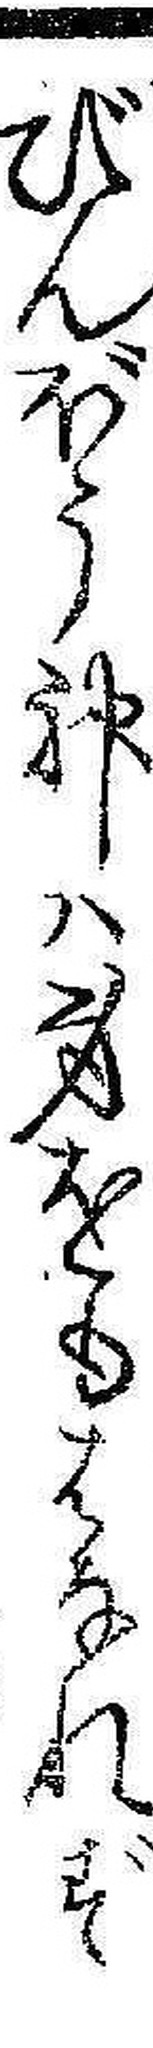びんぼう神は身をもはなれず
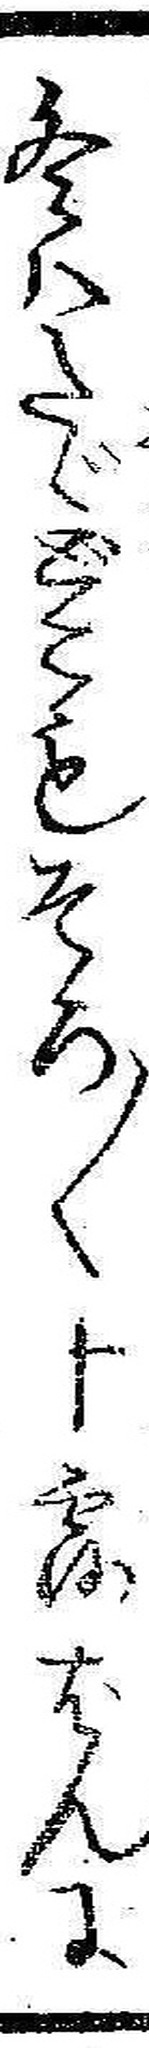冬はたゞどこもそろ〳〵霜ばんに
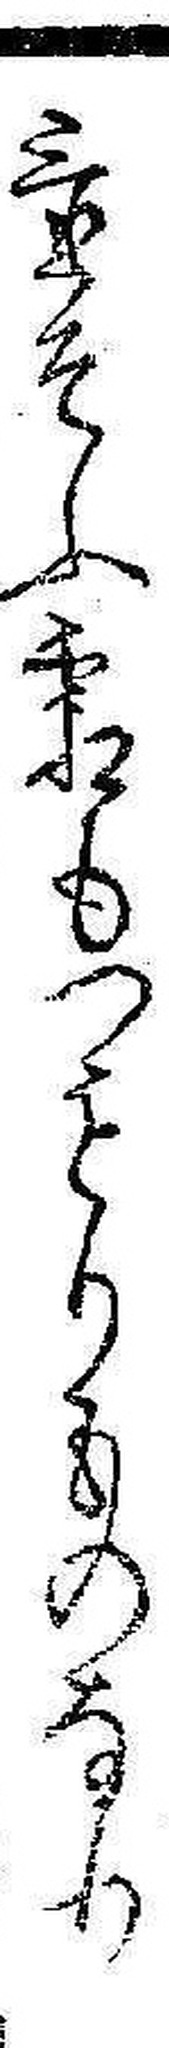置そふ霜もつもりものなり
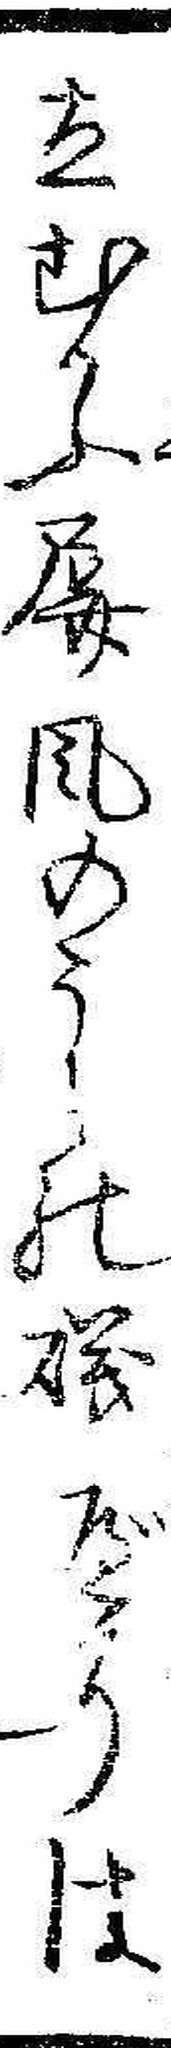立ちむかふ屏風のうらの磯は
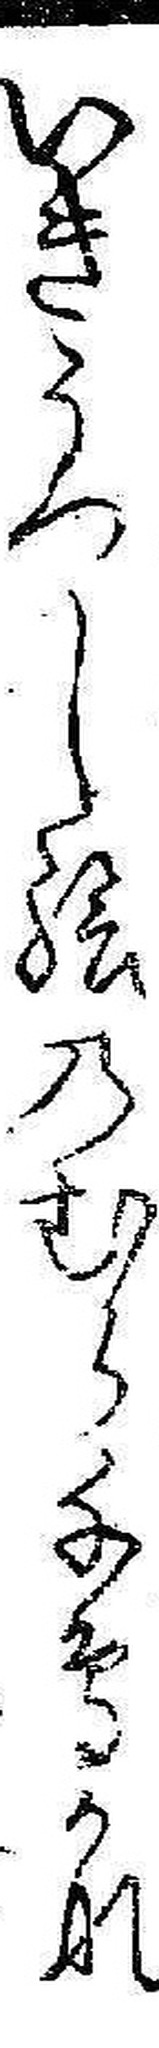いきうつし絵のむら千鳥なれ
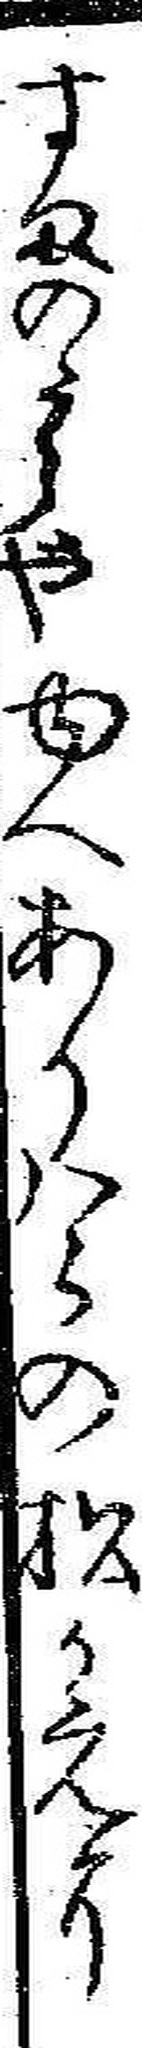すまのうらやゆへありはらの松かえに
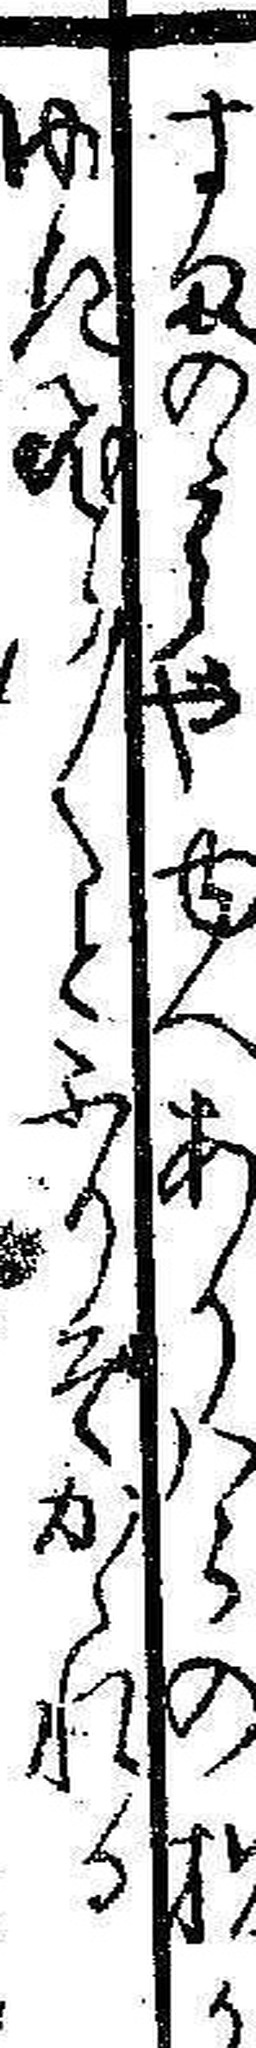ゆきひら〳〵とふりぞかゝれる
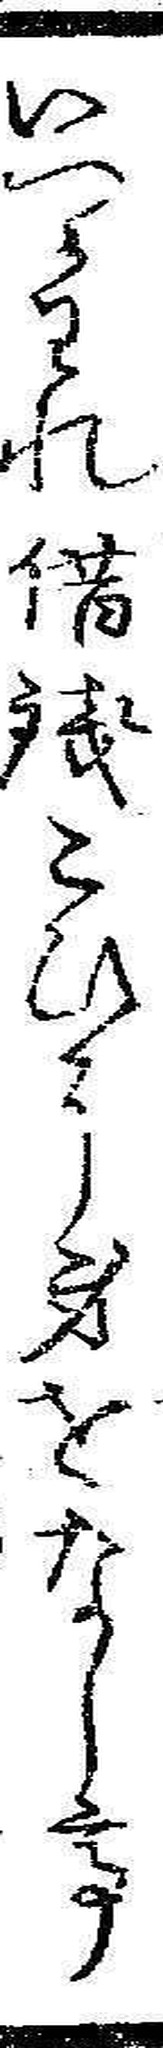いつかわれ借銭こひに身をなして
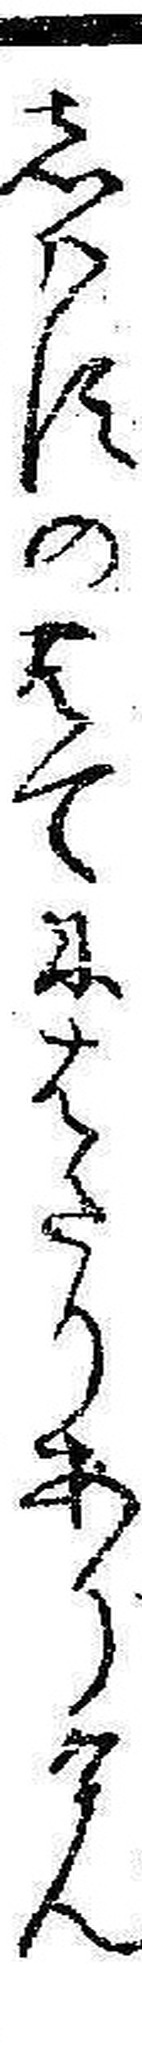しはたのはてにはたりありけん
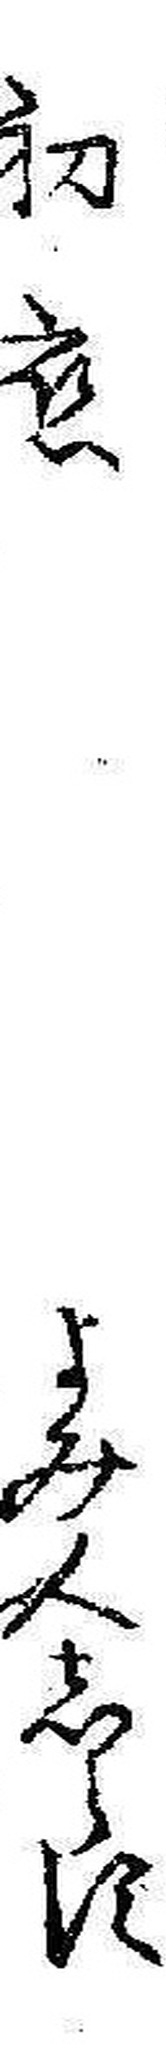初恋よみ人しらす
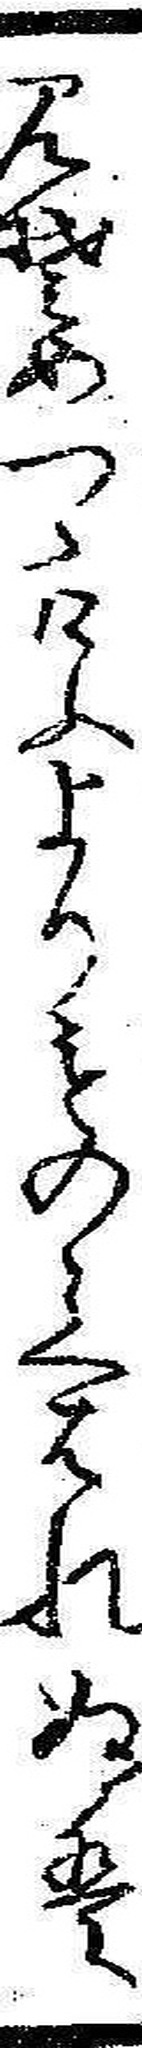みそめつゝけふよりものゝくはれぬは
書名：狂哥はまのきさご
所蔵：国文学研究資料館
